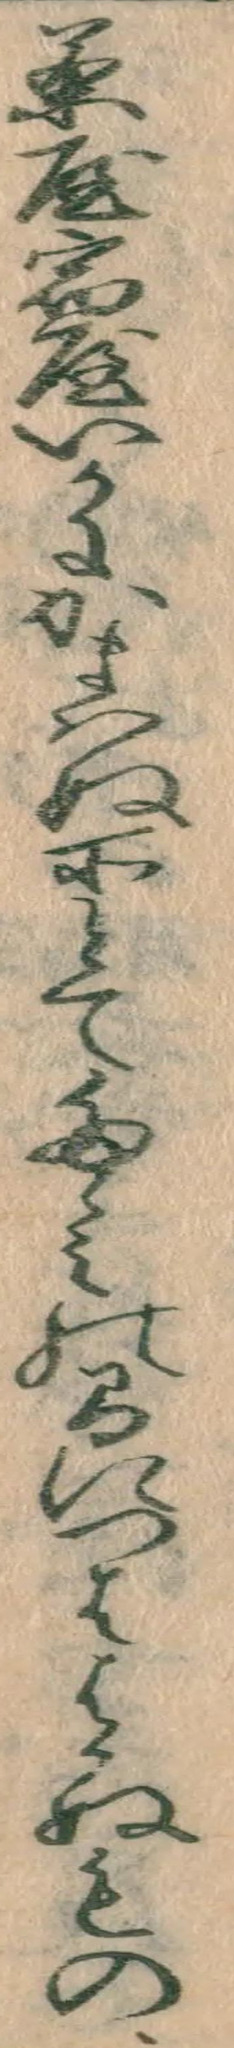茶屋宿屋いかにかまはぬ所とてたゝみの間につははかぬもの
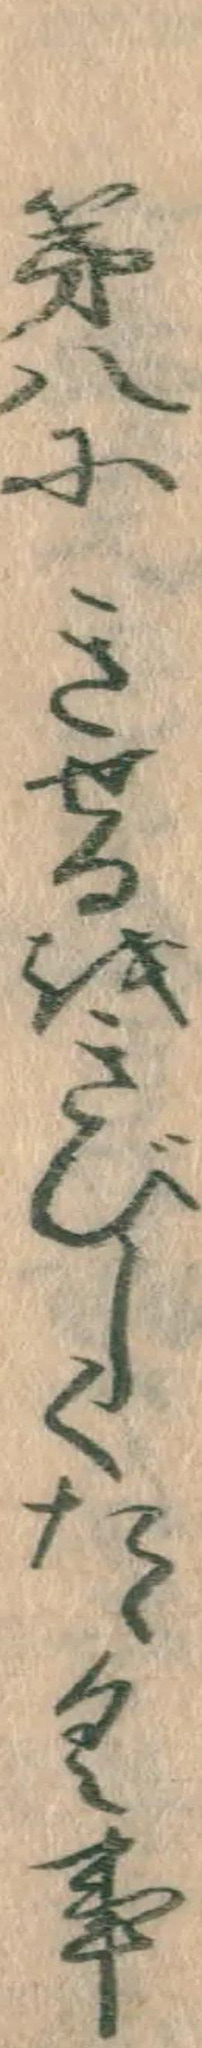第八にきせるをきびしくたゝく事
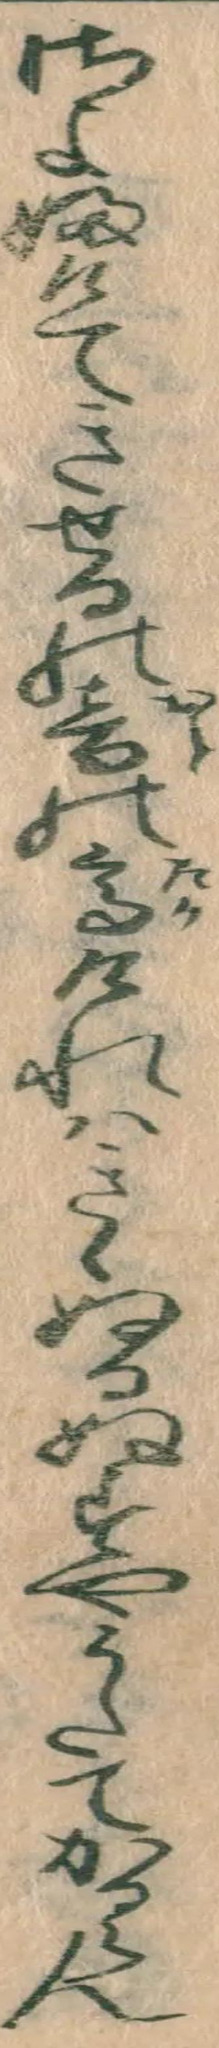さよふけてきせるの音の高けれはきゝぬるぬすやうたてかるらん
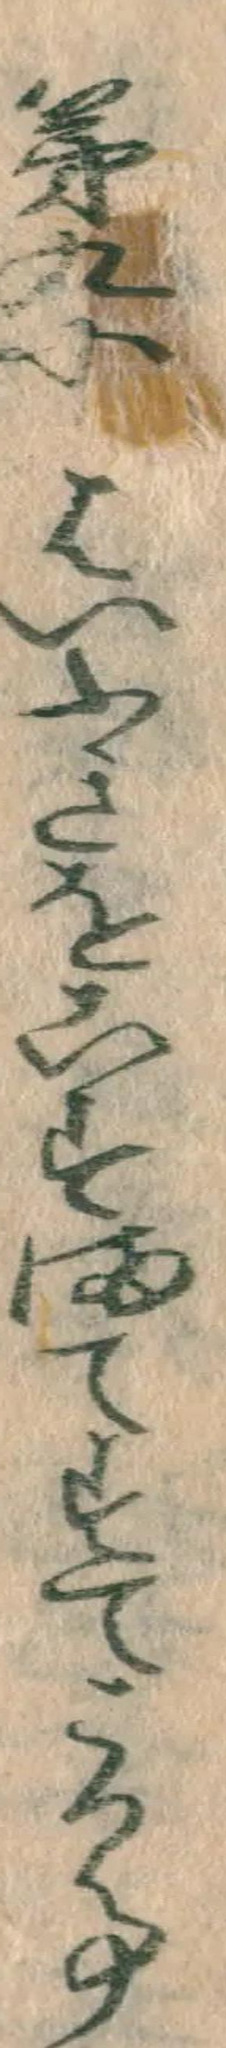第九にはいふきをこすまてすてる事
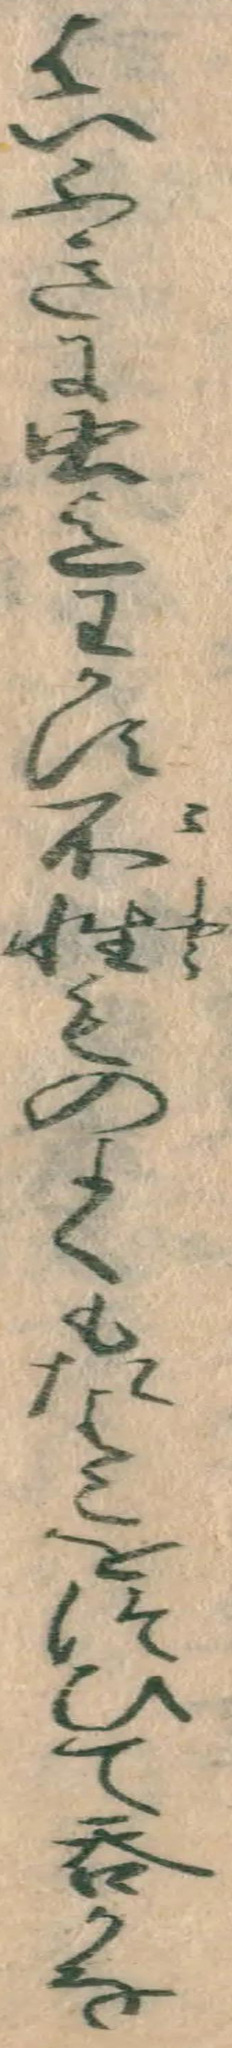はいふきに虫迄わかす不性ものよくもたはこをつひて呑かな
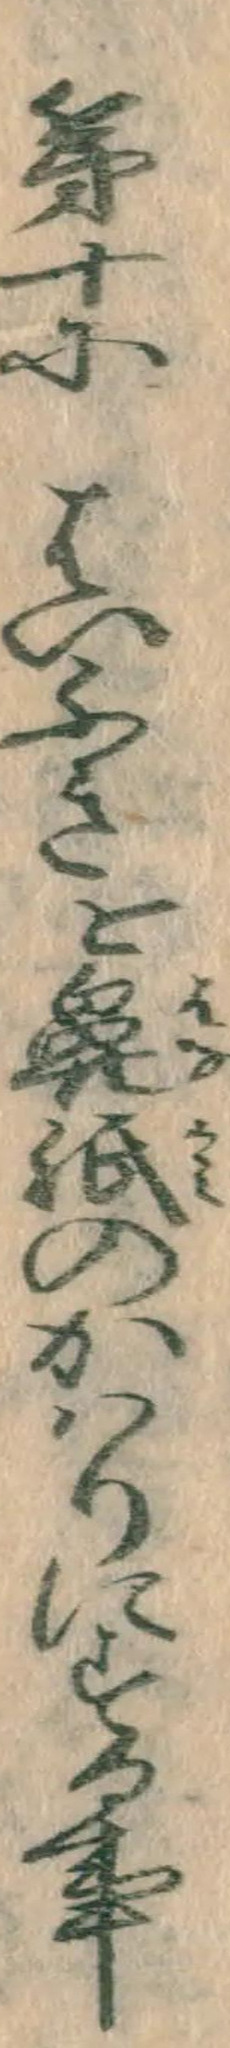第十にはいふきを鼻紙のかはりにする事
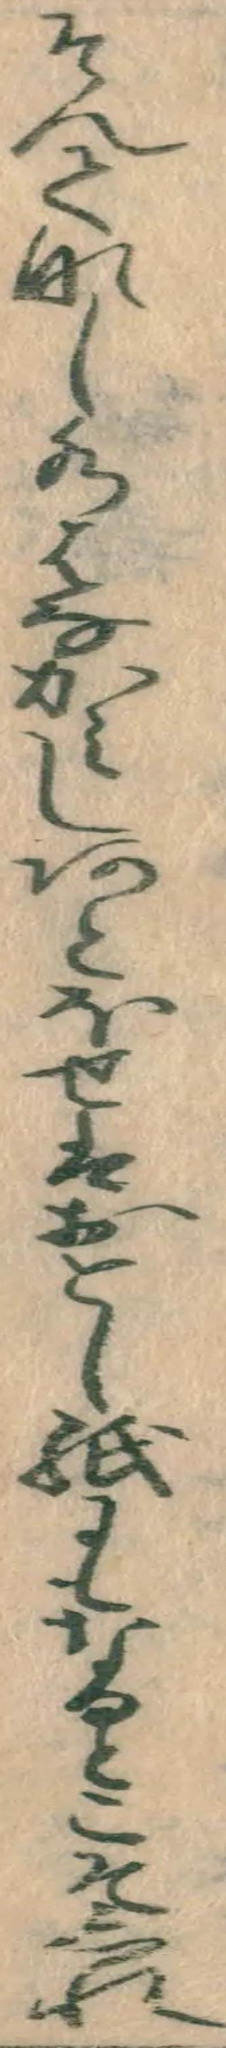そんてなし水はなかみしあとほせはおとし紙にもなるとこそしれ

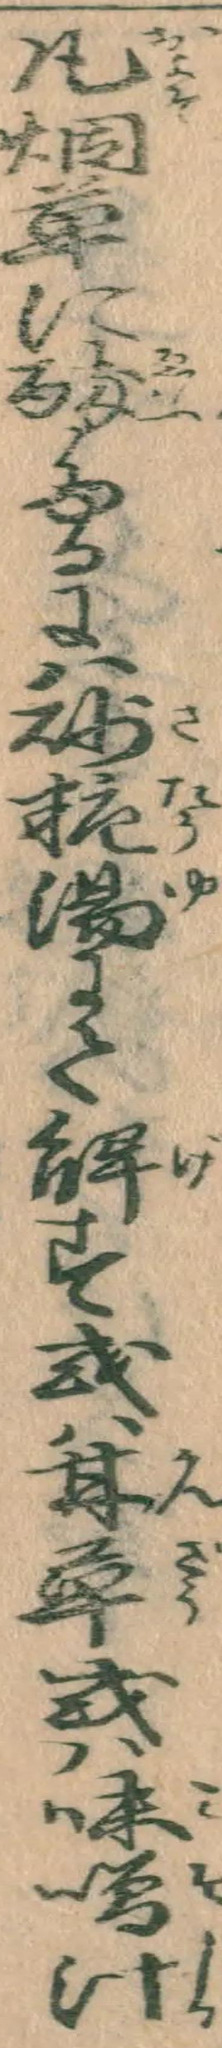凡烟草に醉たるには砂糖湯にて解す或は甘草或は味噌汁
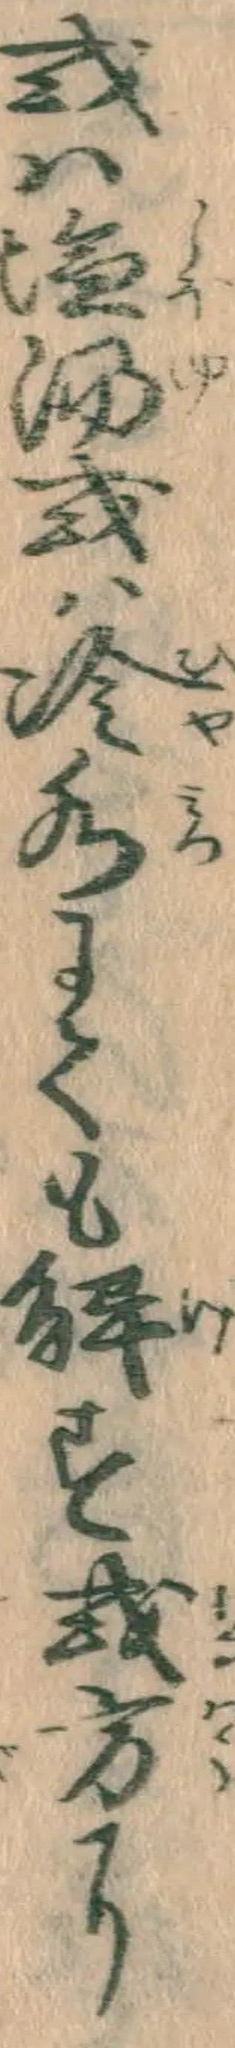或は塩湯或は冷水にても解す或方に
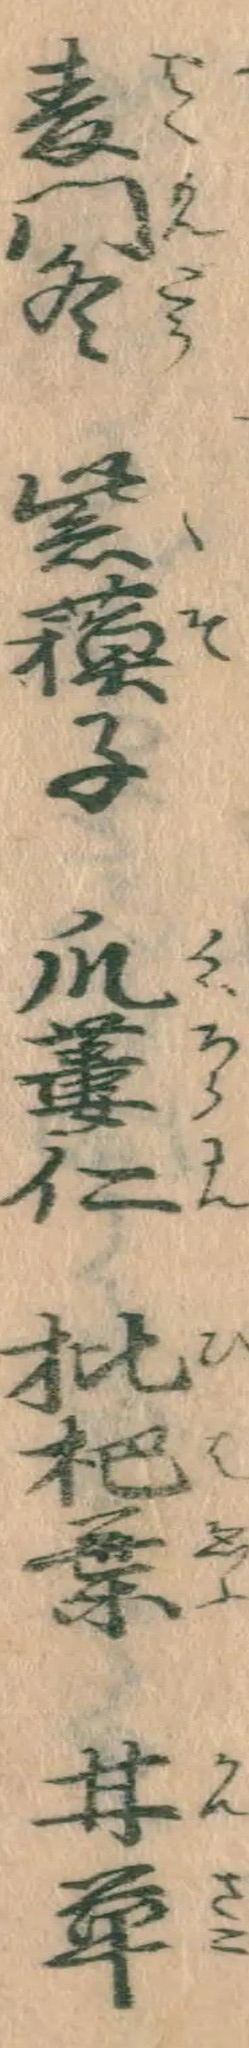麦門冬紫蘇子瓜蔞仁枇杷葉甘草
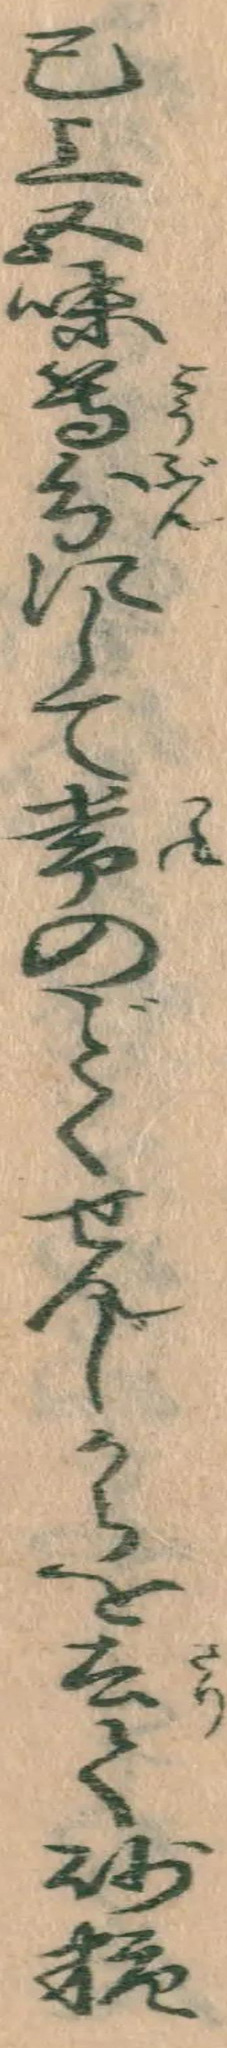已上五味等分にして常のごとくせんじからを去て砂糖
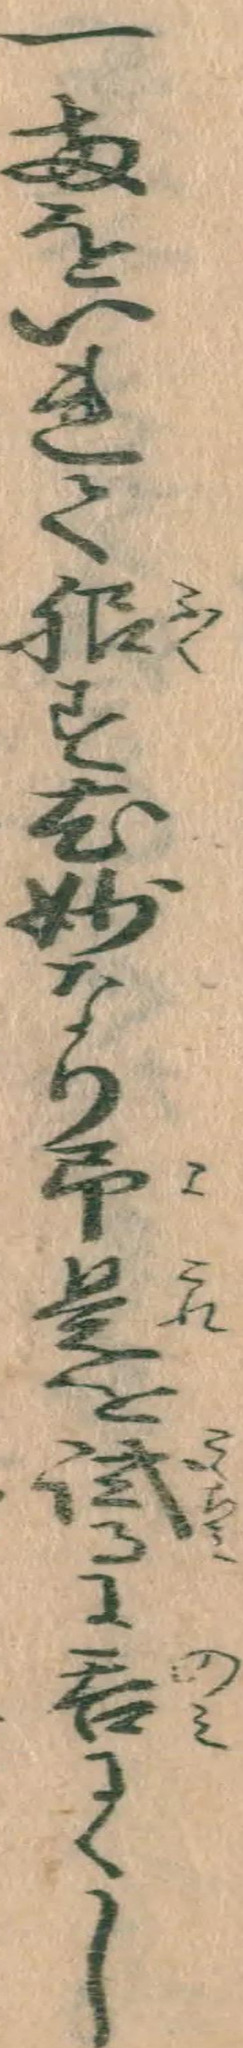一両をいれて服す尤妙なり予是を試るに呑にくし
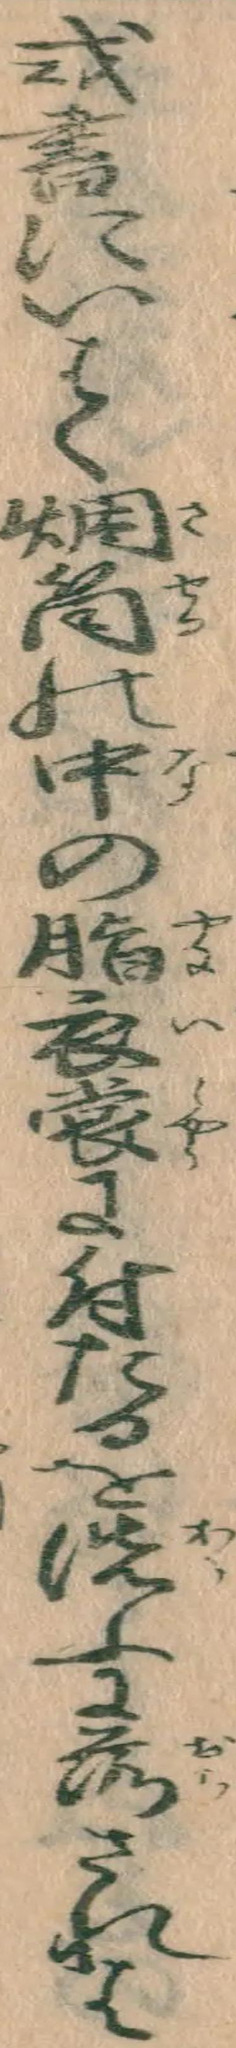或書にいはく烟筒の中の脂衣裳に付たるを洗ふに落されは
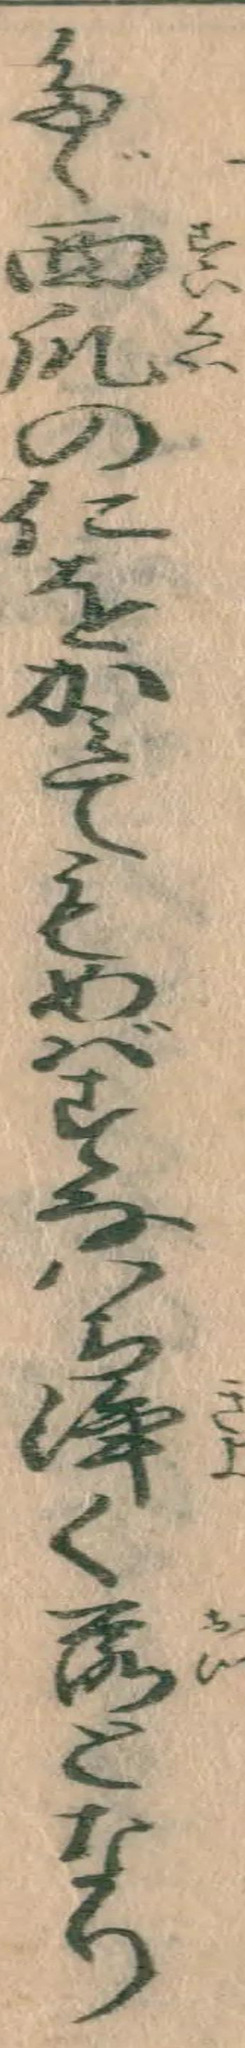たゞ西瓜の仁を加えてもめばすなはち淨く落となり
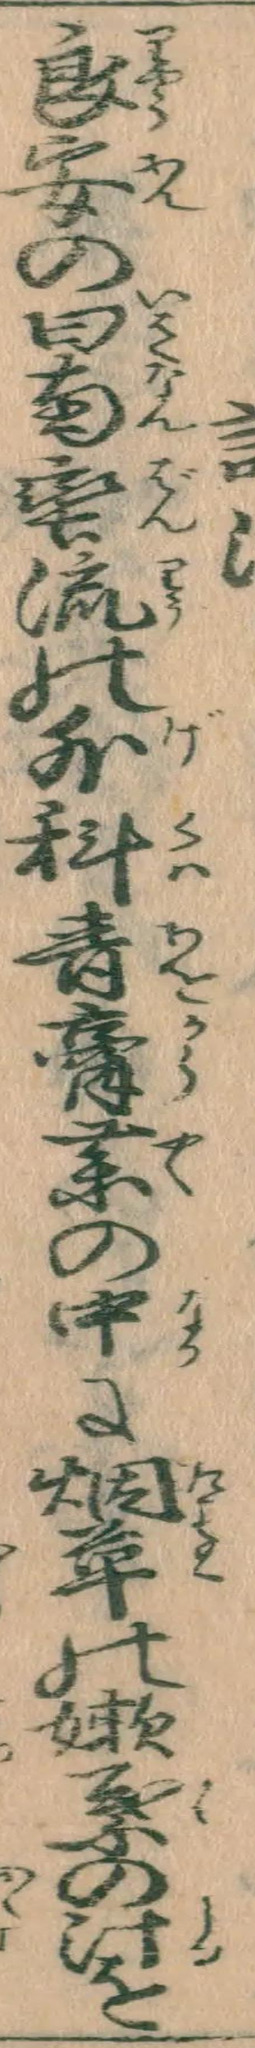良安の曰南蛮流の外科青膏薬の中に烟草の嫩葉の汁を
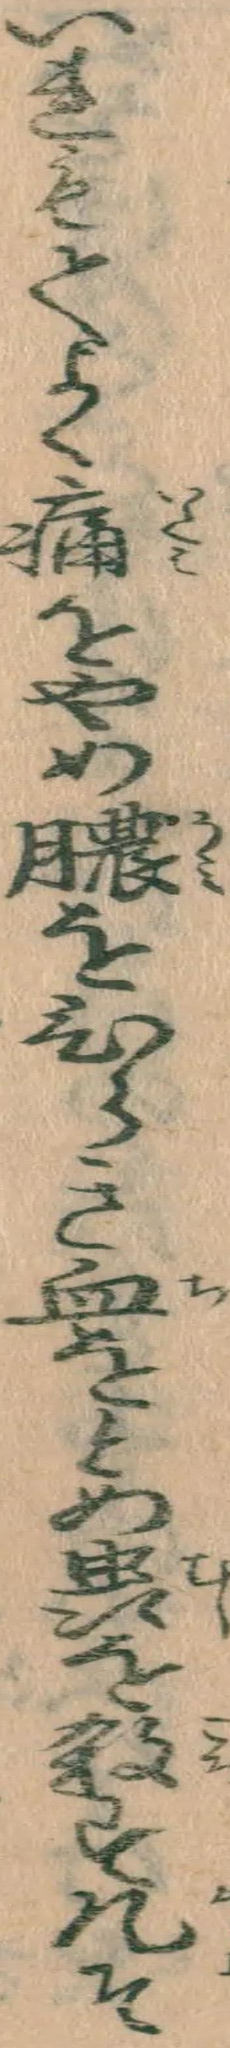いれもてよく痛をやめ膿をひらき血をとめ虫を殺す凡そ
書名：煙草記
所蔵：国立国会図書館 National Diet Library, JAPAN
